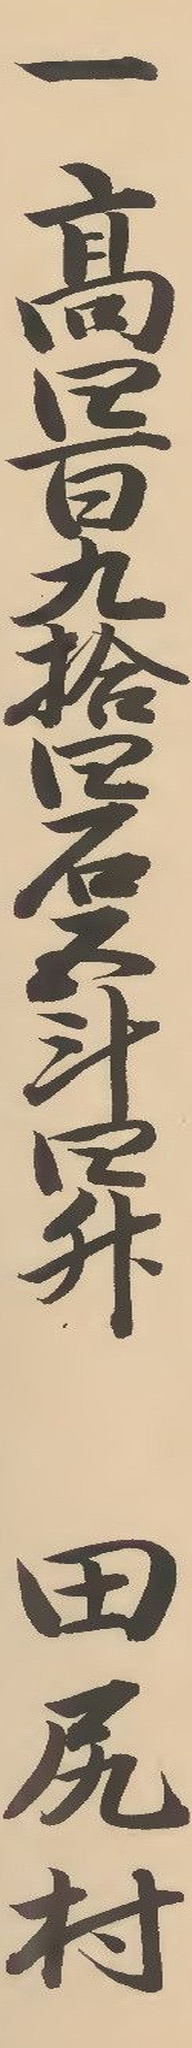一高四百九拾四石五斗四升田尻村
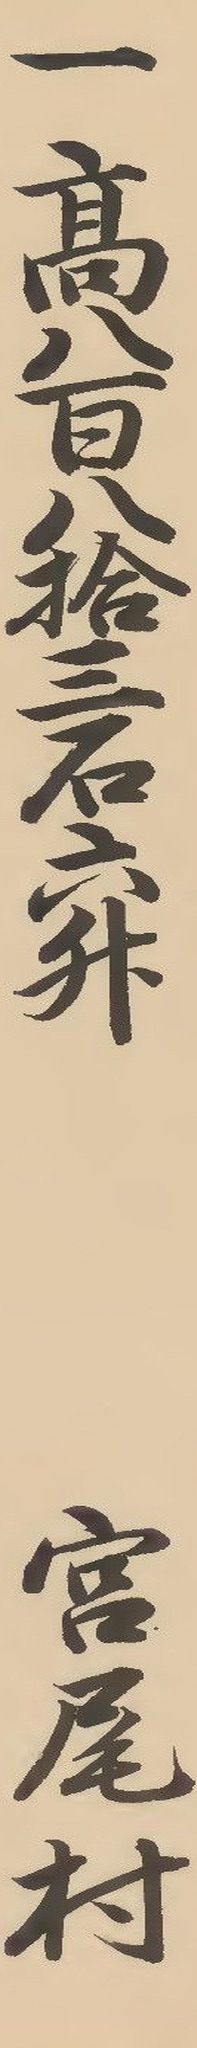一高八百八拾三石六升宮尾村
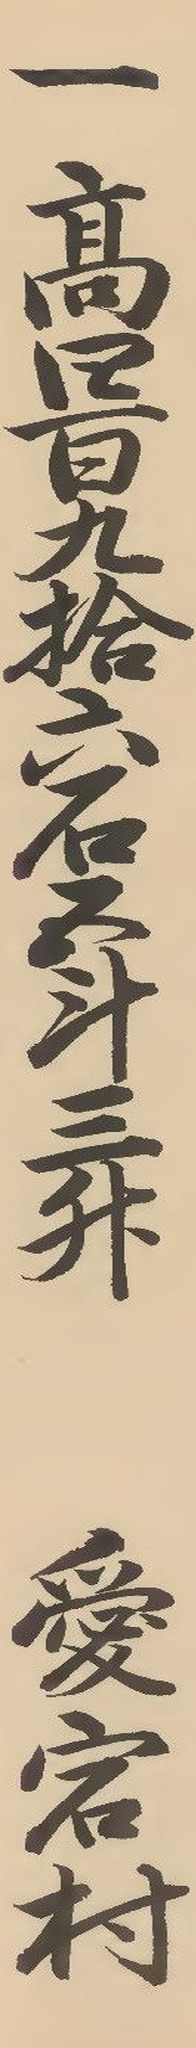一高四百九拾六石五斗三升愛宕村
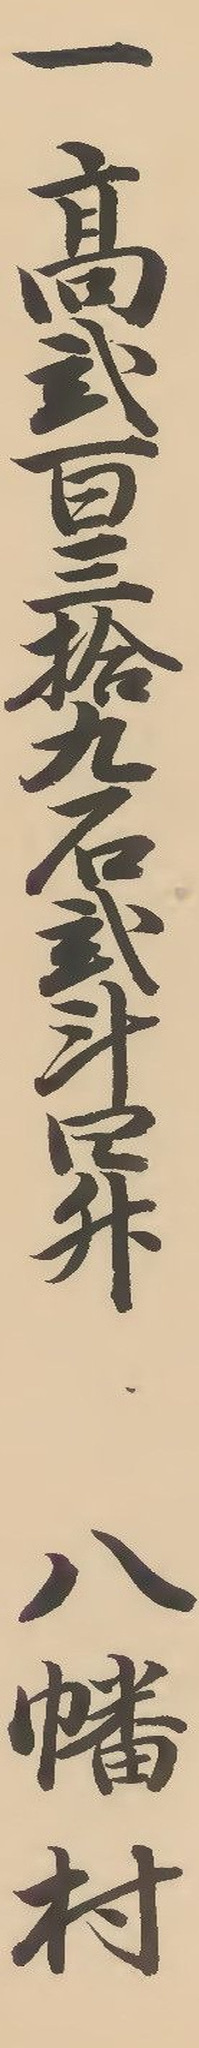一高弐百三拾九石弐斗四升八幡村

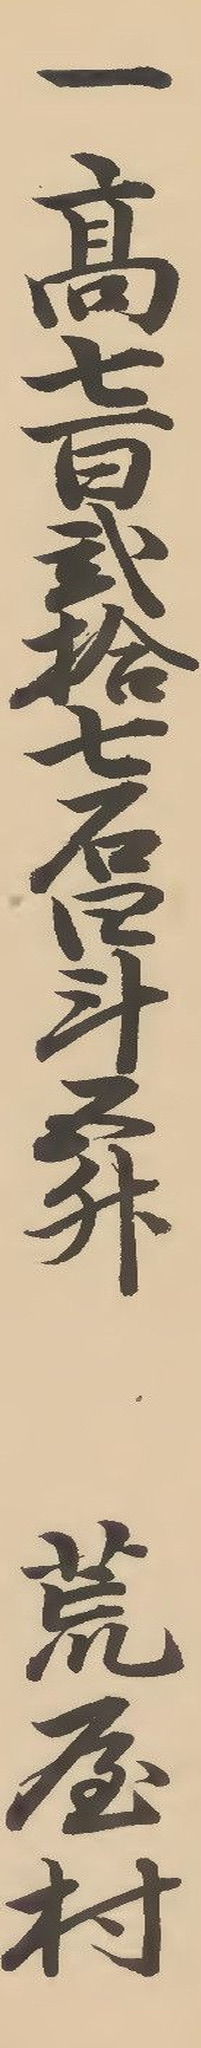一高七百弐拾七石四斗五升荒屋村
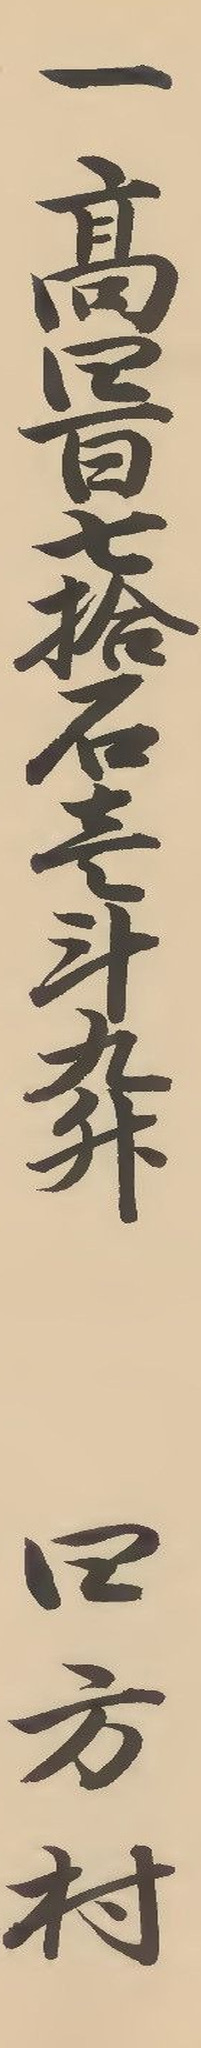一高四百七拾石壱斗九升四方村
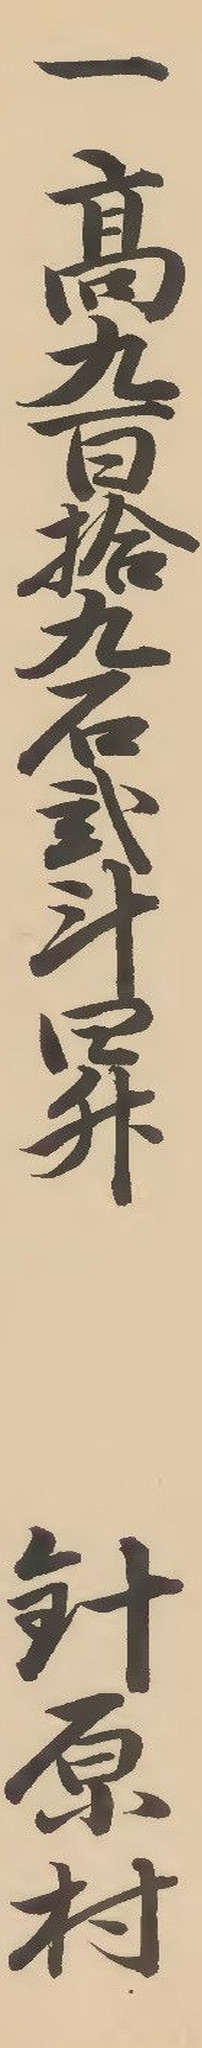一高九百拾九石弐斗四升針原村
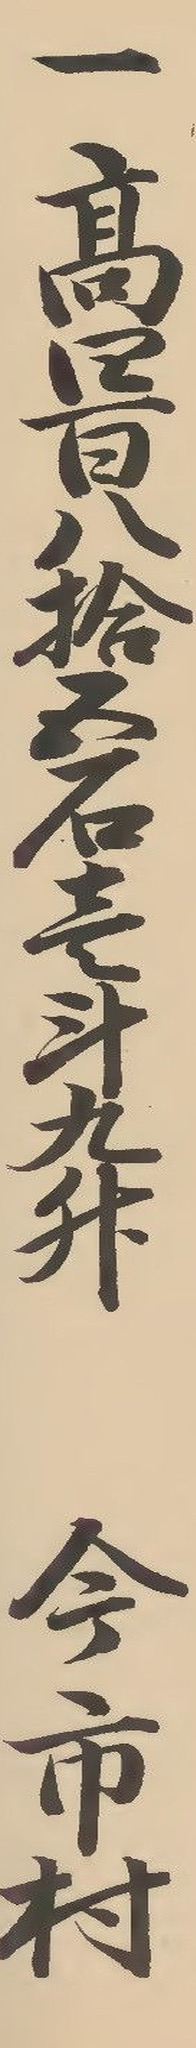一高四百八拾五石壱斗九升今市村
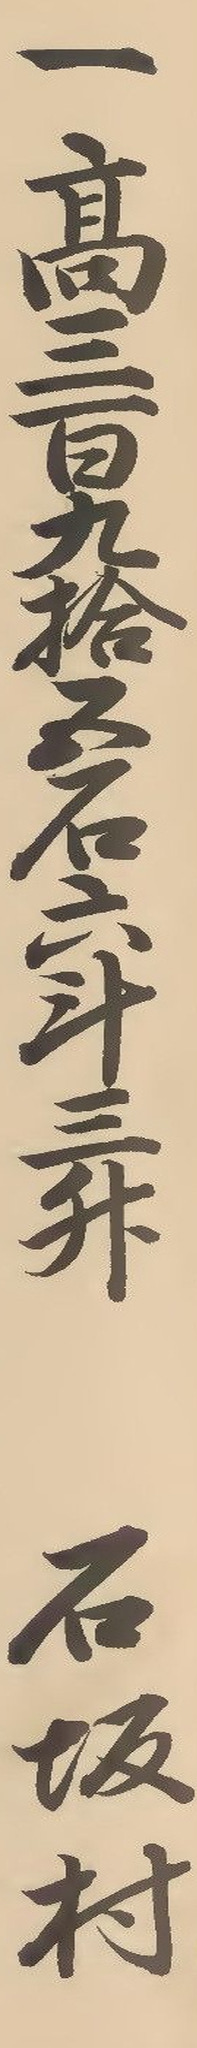一高三百九拾五石六斗三升石坂村
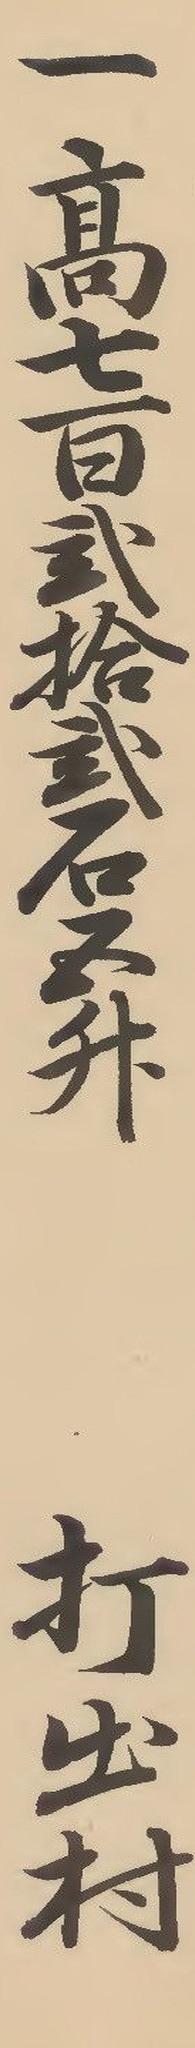一高七百弐拾弐石五升打出村
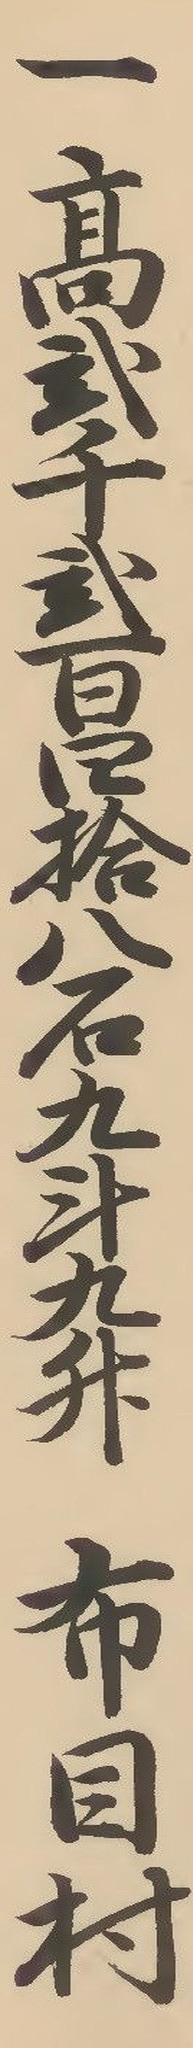一高弐千弐百四拾八石九斗九升布目村
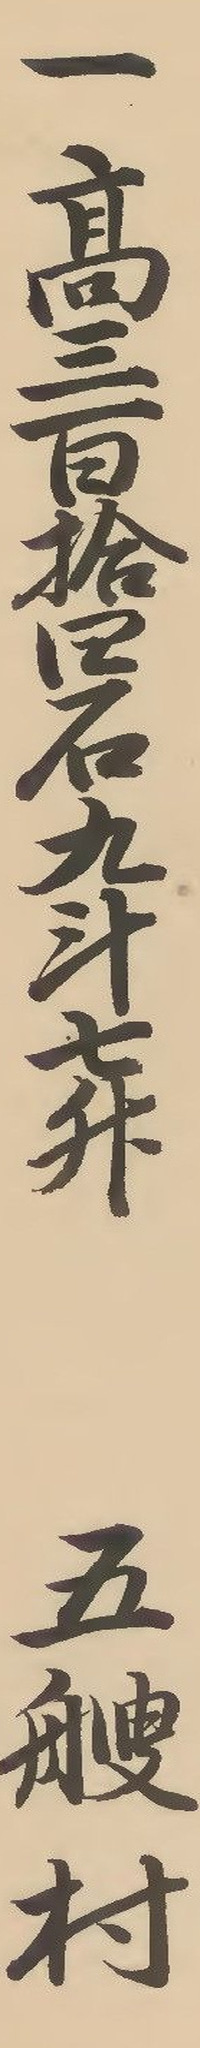一高三百拾四石九斗七升五艘村

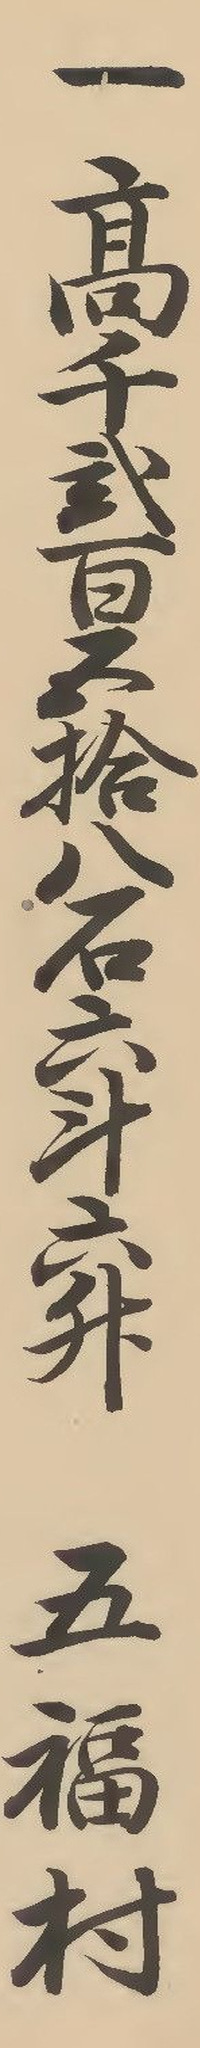一高千弐百五拾八石六斗六升五福村
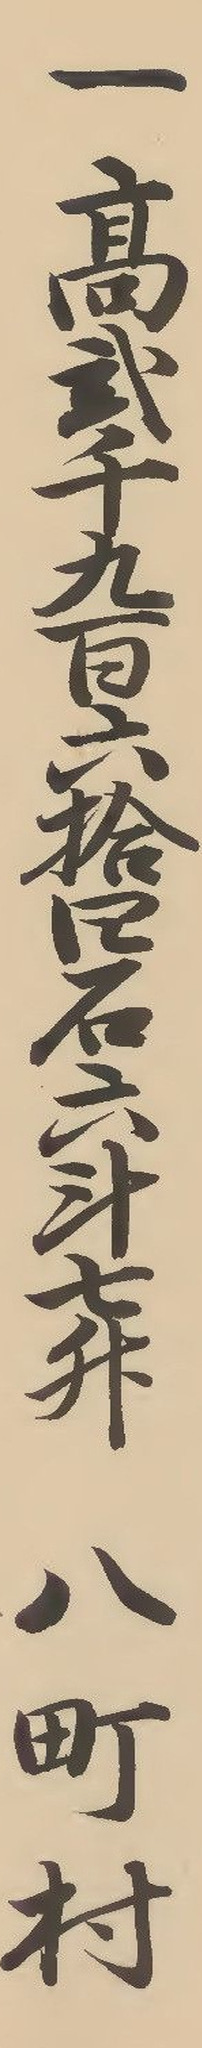一高弐千九百六拾四石六斗七升八町村
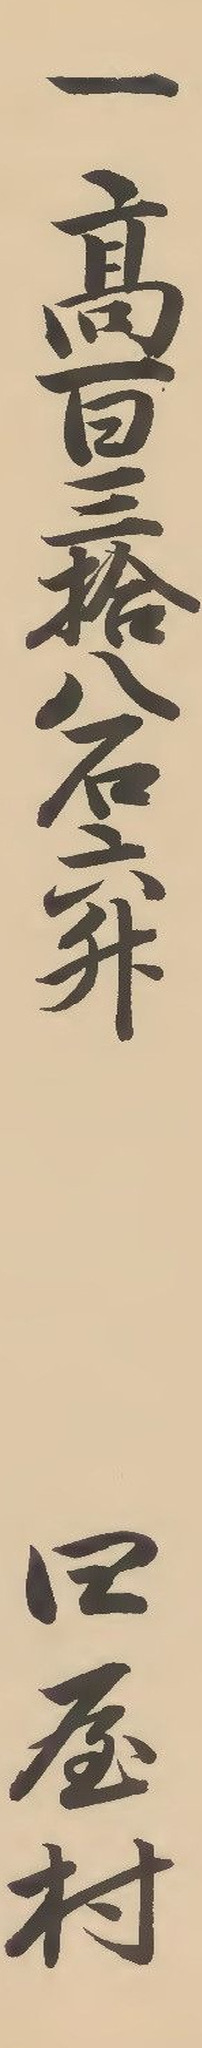一高百三拾八石六升四屋村
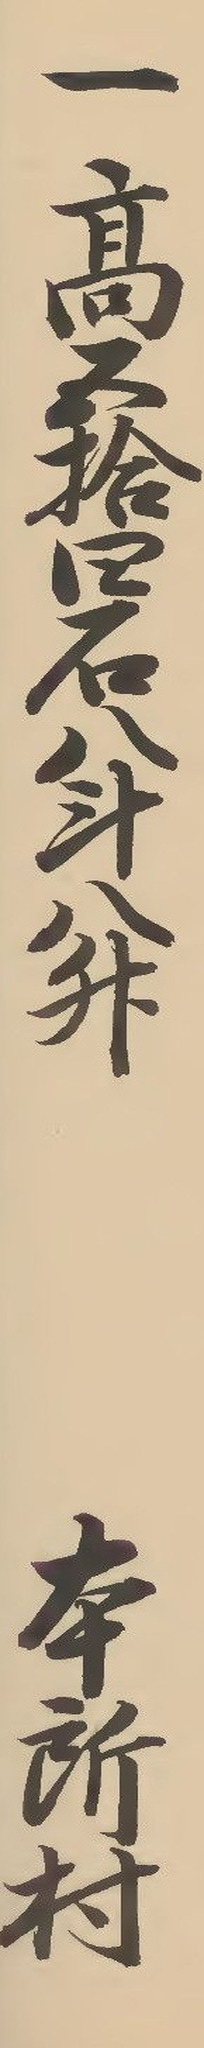一高五拾四石八斗八升本所村
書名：越中国郷帳
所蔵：国立公文書館 National Archives of Japan
